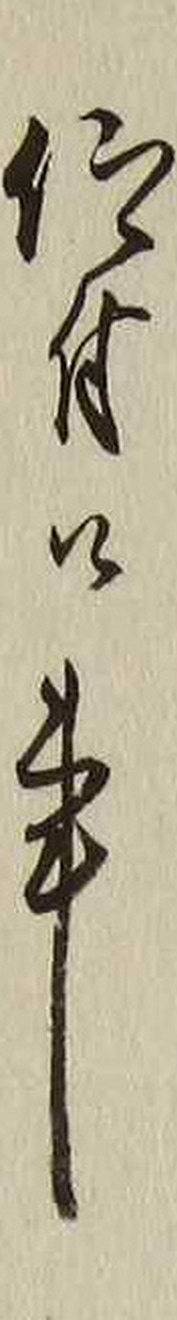仰付候事
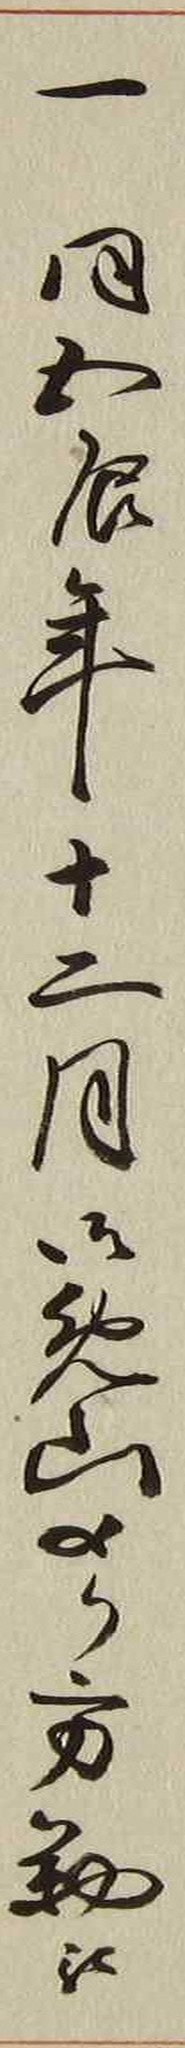一同五辰年十二月御免山〆り方勤被
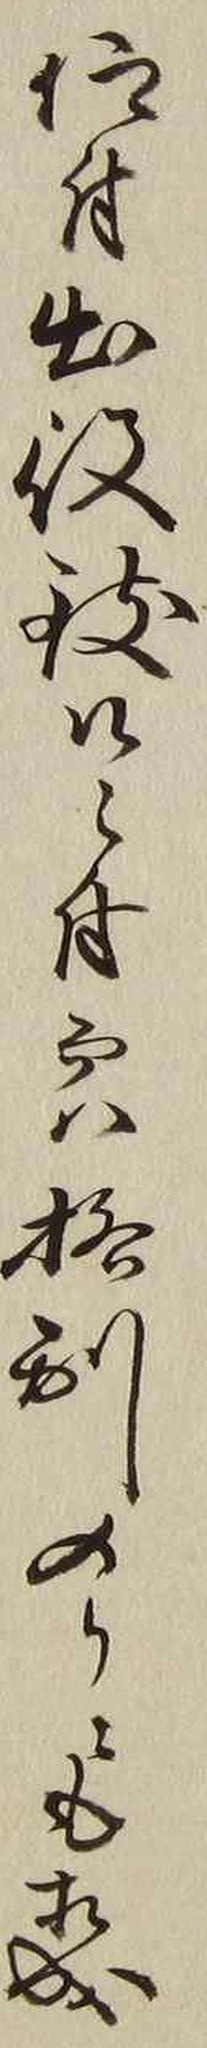仰付出役致候ニ付而ハ格別〆りニも相成
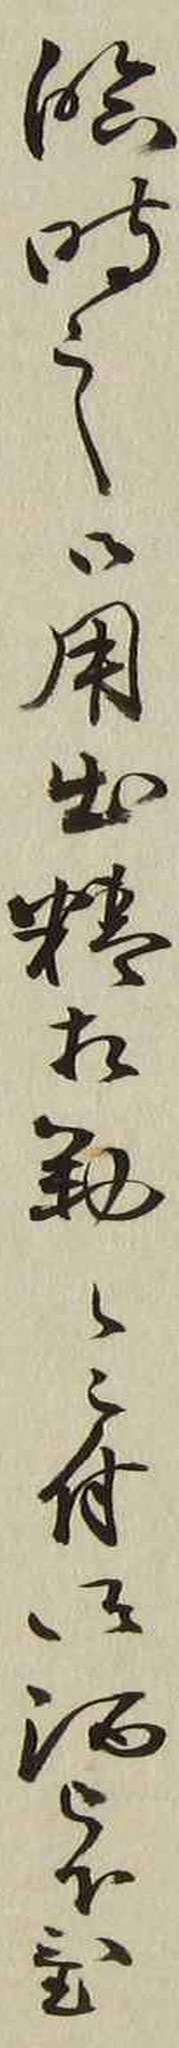臨時之御用出精相勤候ニ付御酒被下置
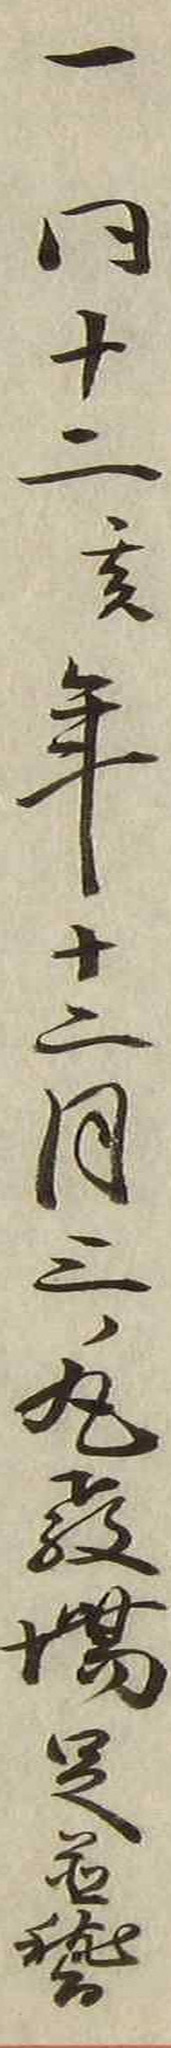一同十二亥年十二月三ノ丸教場足並稽

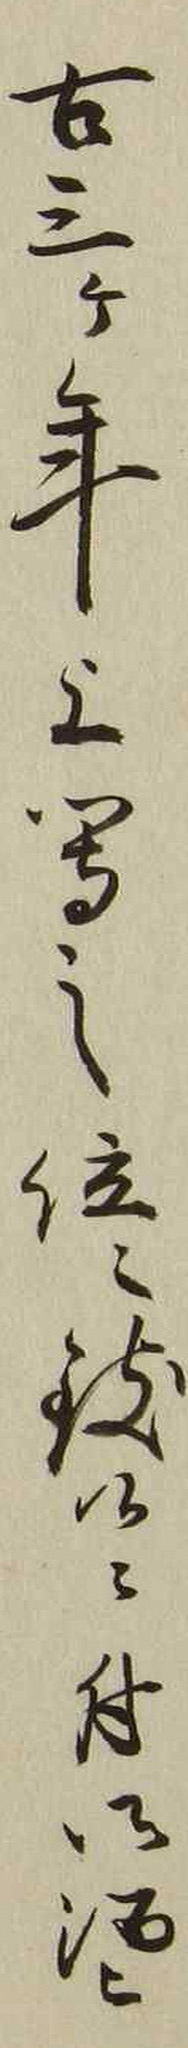古三年ケ上等之位ニ致候ニ付御酒被
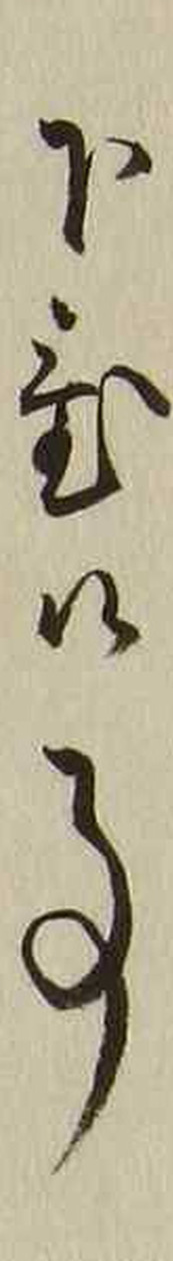下置候事
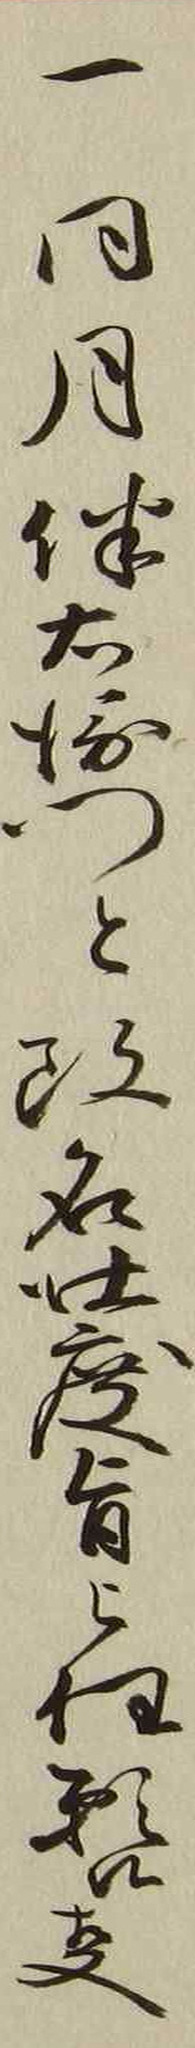一同月伴右衛門と改名仕度旨被任願候事
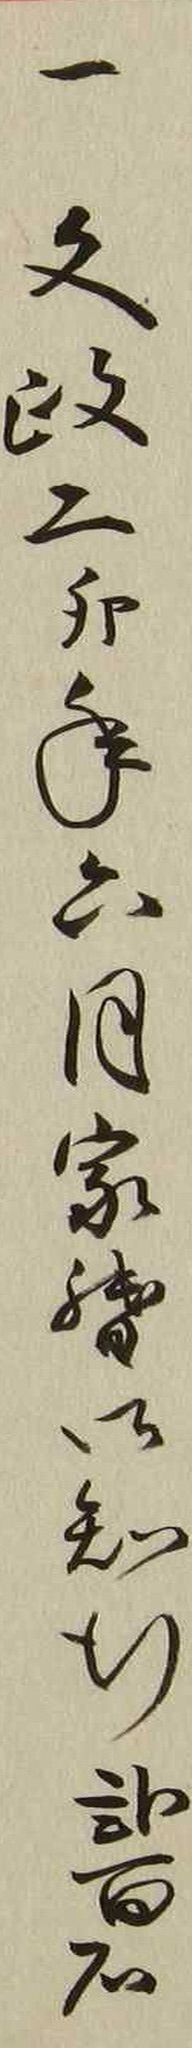一文政二卯年六月家督御知行弐百石
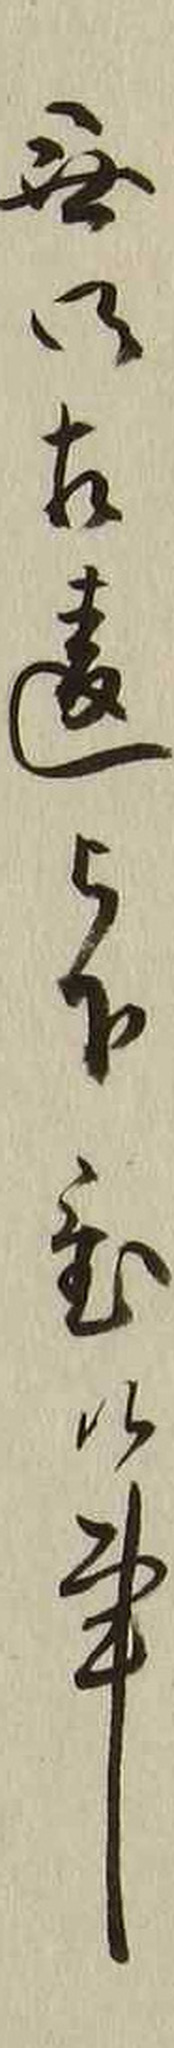無御相違被下置候事
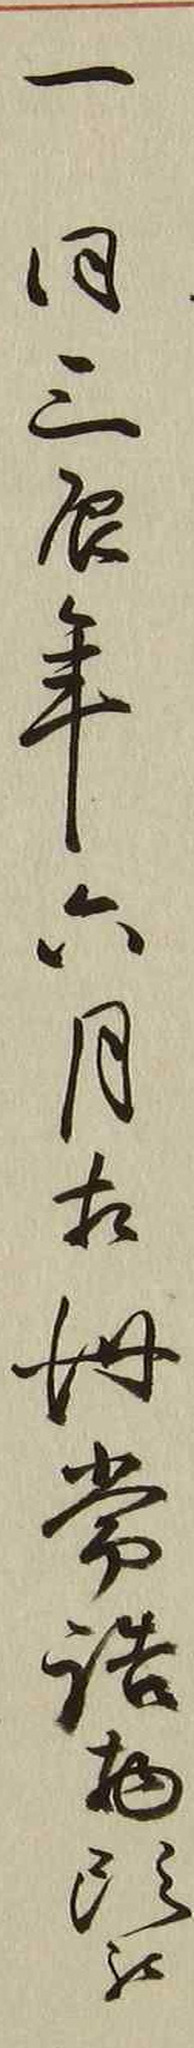一同三辰年六月相州常詰物頭被
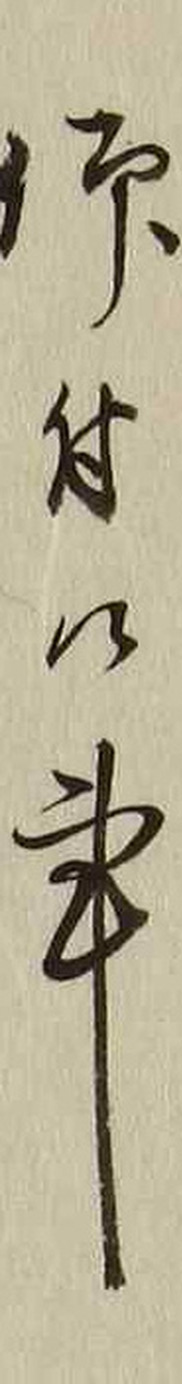仰付候事
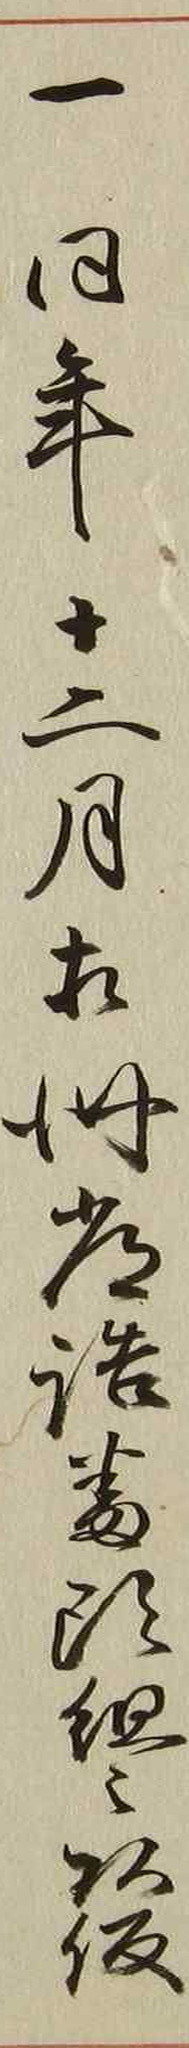一同年十二月相州常詰番頭組々頭仮
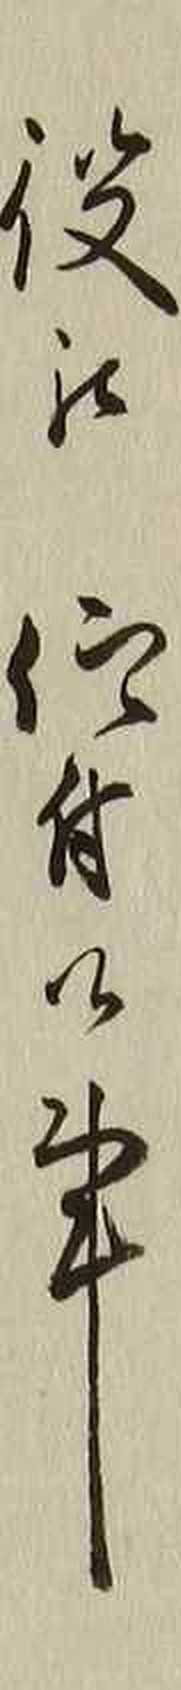役被仰付候事
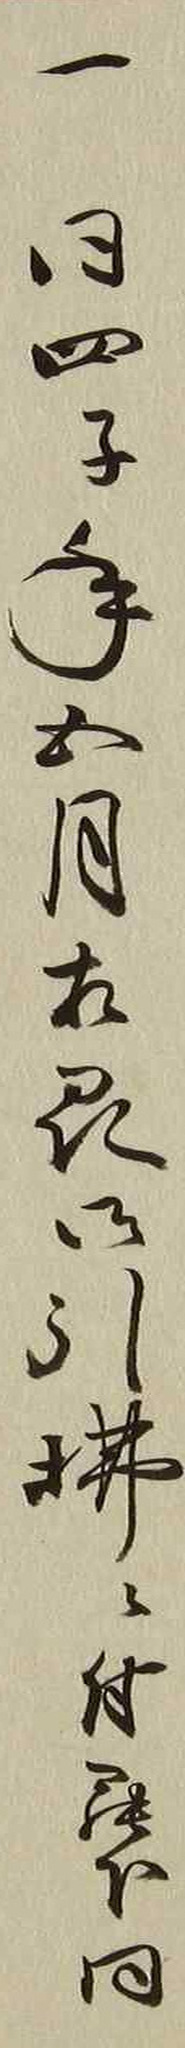一同四子年五月相州御引払ニ付罷下同
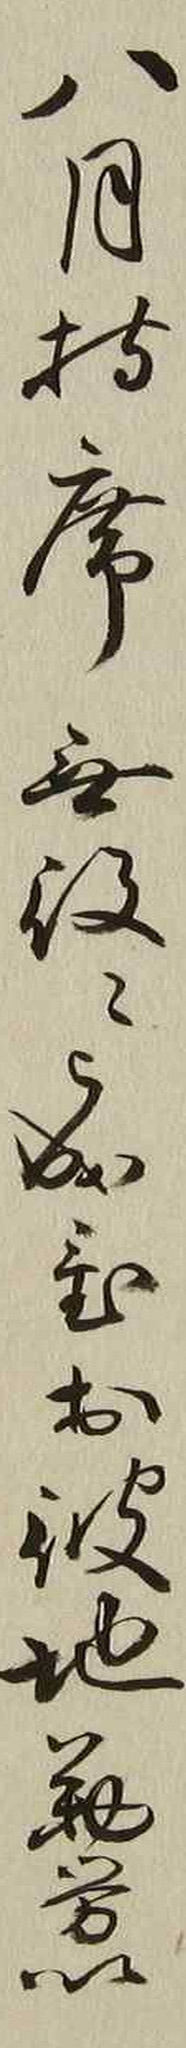八月持席無役ニ被成置於彼地勤労い
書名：諸士系譜　巻之15　い之部15
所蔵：会津若松市立会津図書館
